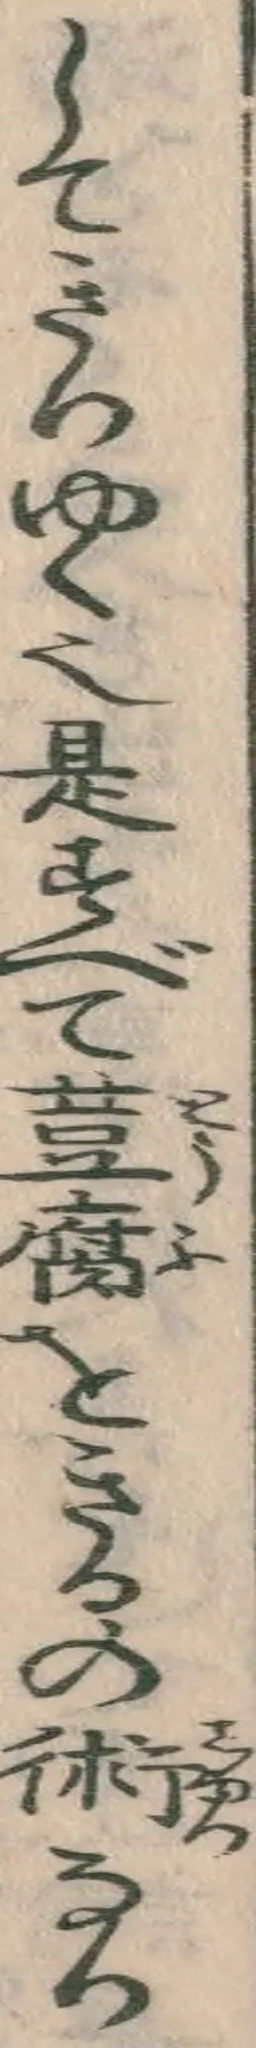してきりゆく也是すべて荳腐をきるの術なり
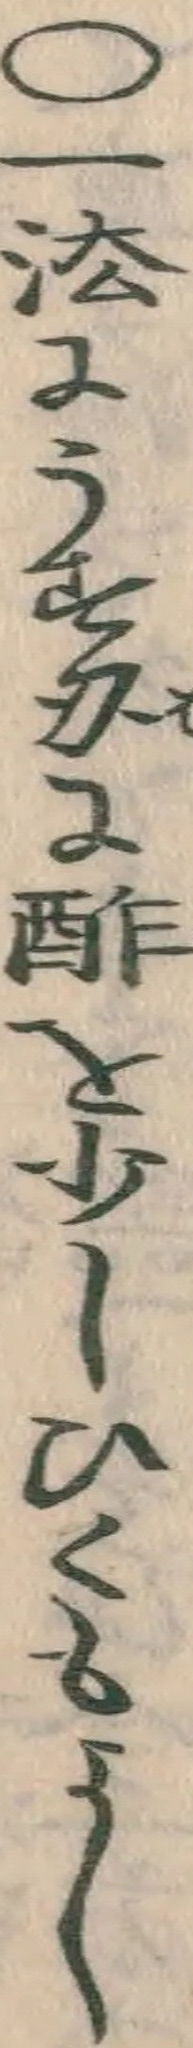○一法にうす刃に酢を少しひくもよし
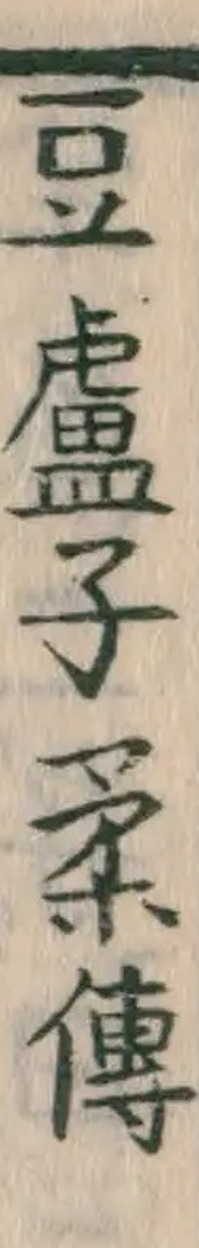豆廬子柔伝

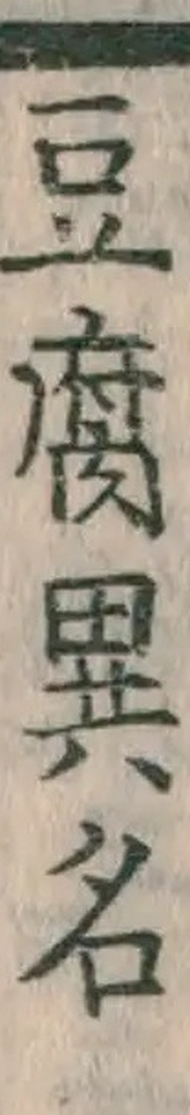豆腐異名

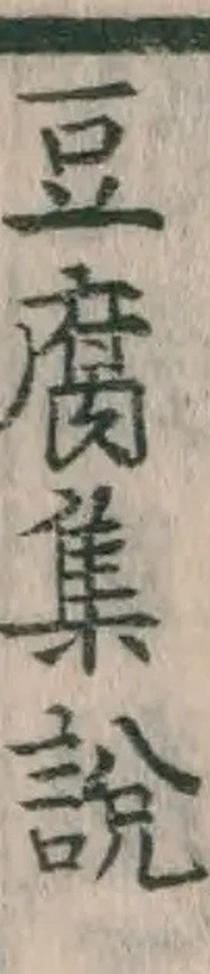豆腐集説
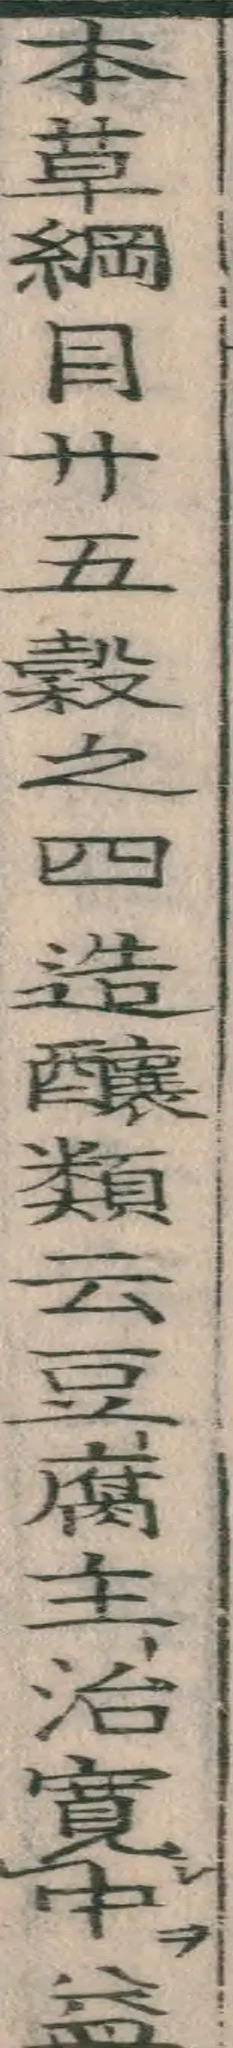本草綱目廿五穀之四造醸類云豆-腐主-治寛中益

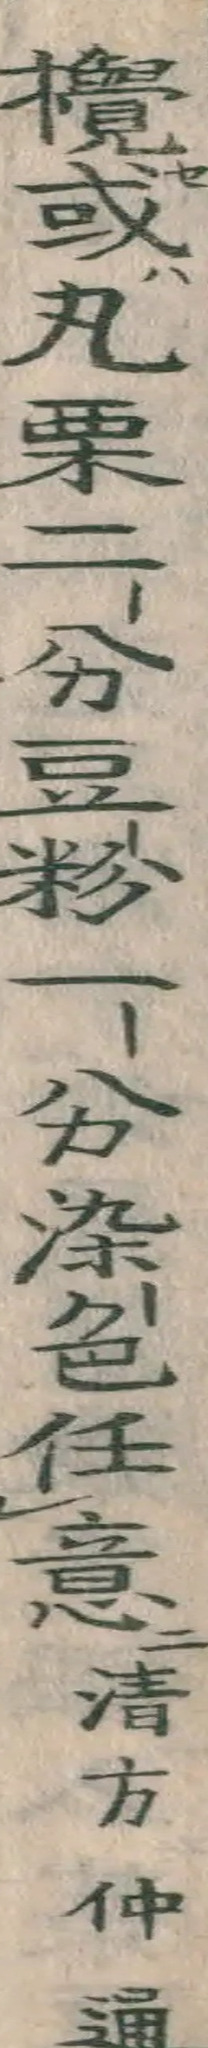攪或丸栗二-分豆-粉一-分染-色任意清方仲通
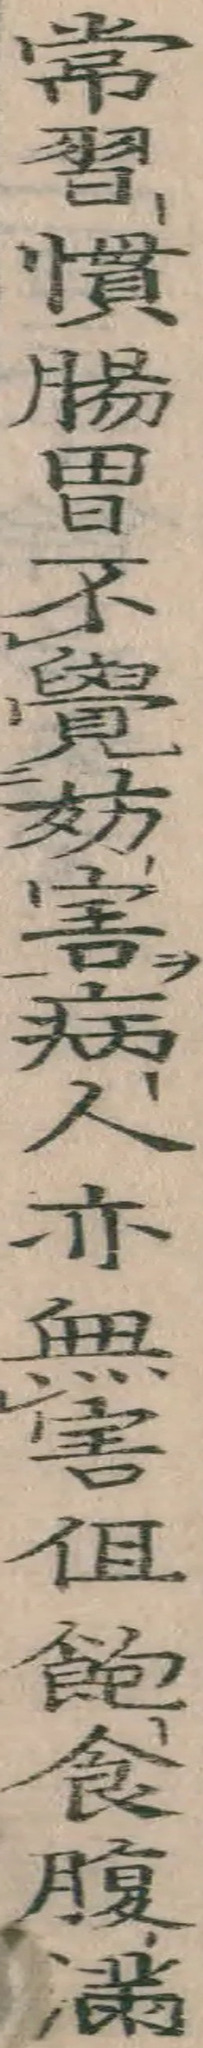常習-慣腸胃不覚妨-害病-人亦無害伹飽-食腹-満

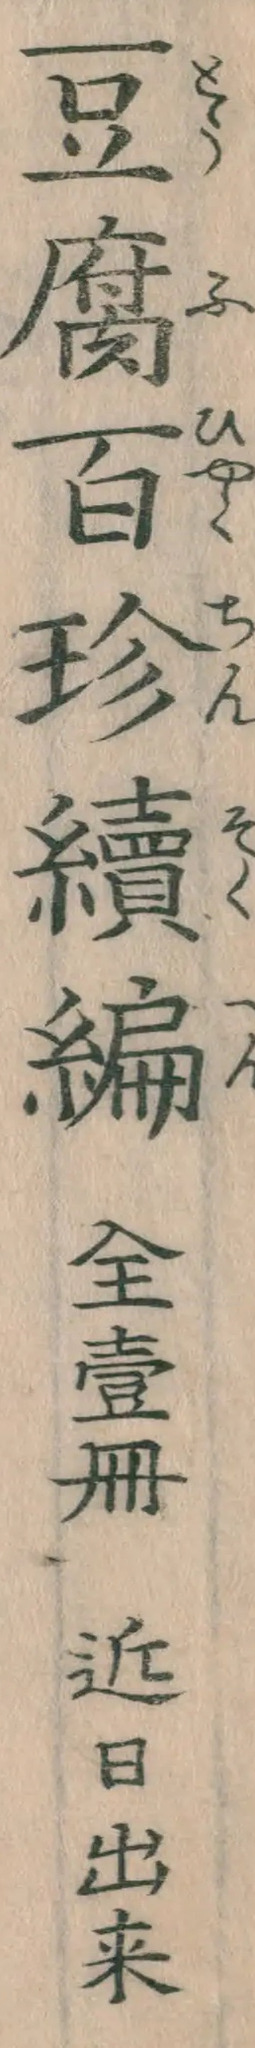豆腐百珍続編全壹冊近日出来
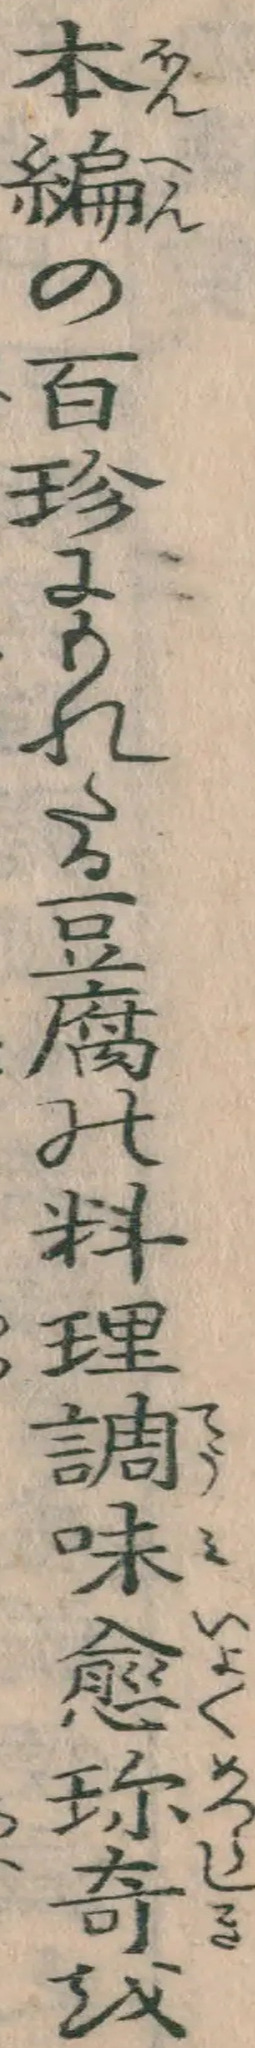本編の百珍にもれたる豆腐の料理調味愈珍奇を
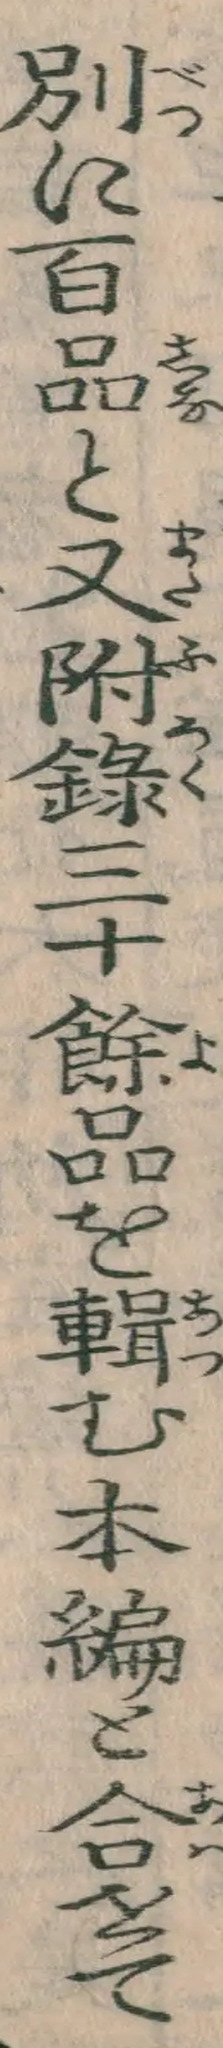別に百品と又付録三十余品を輯む本編と合せて
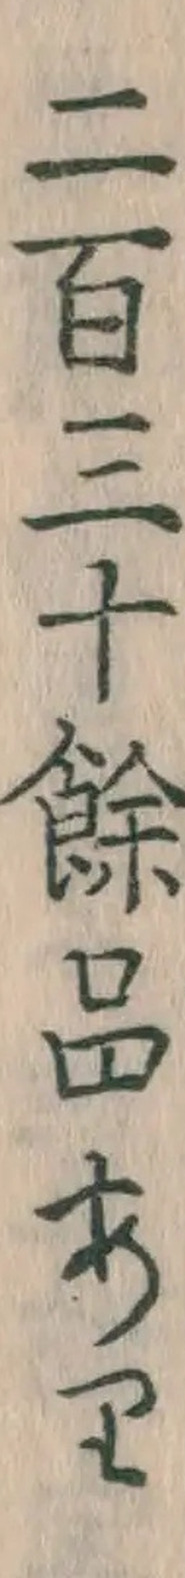二百三十余品あり
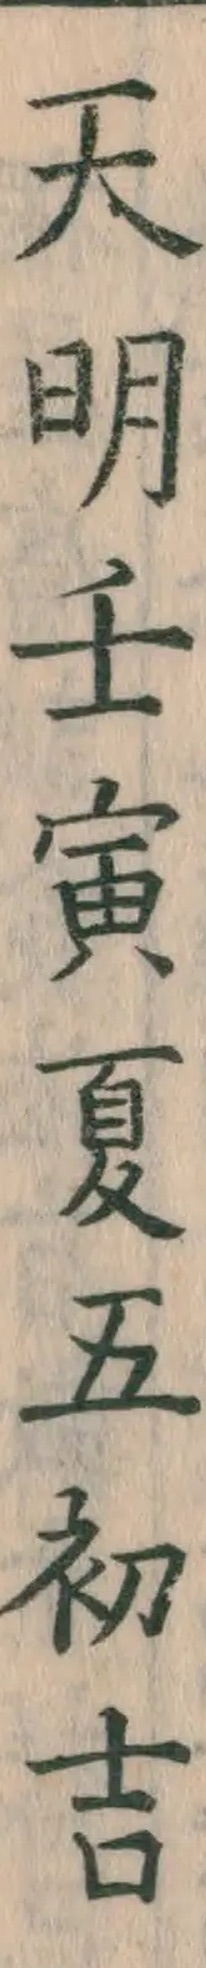天明壬寅夏五初吉
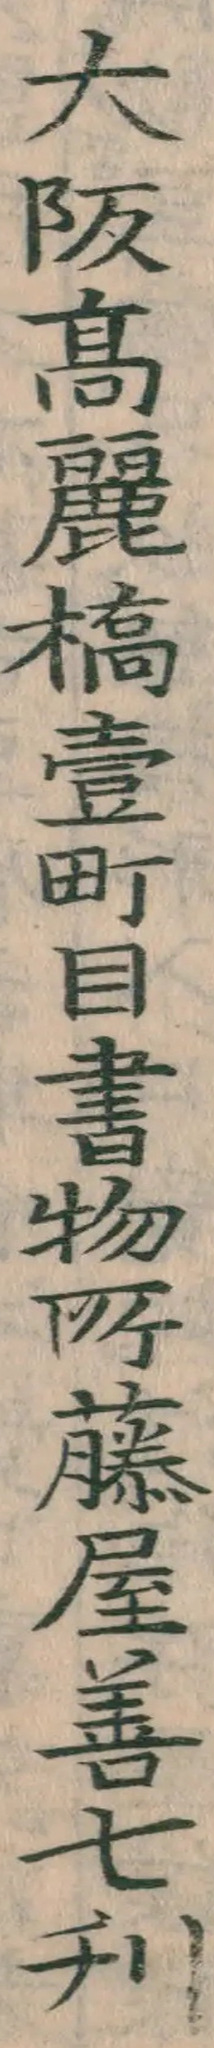大阪高麗橋壹町目書物所藤屋善七刊
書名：豆腐百珍. [正編]
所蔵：国立国会図書館 National Diet Library, JAPAN
